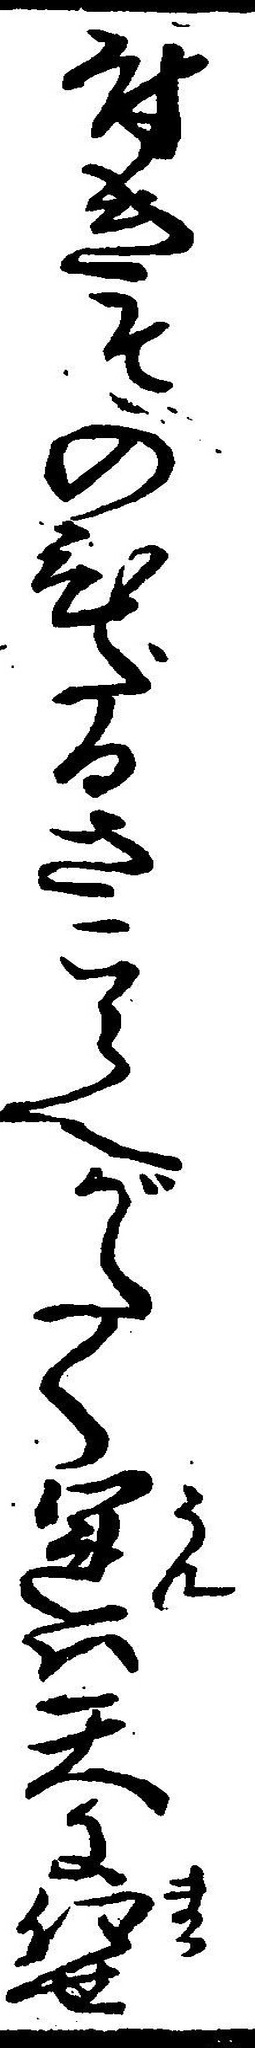付きそのひだるさこらへがたく運は天に任せ
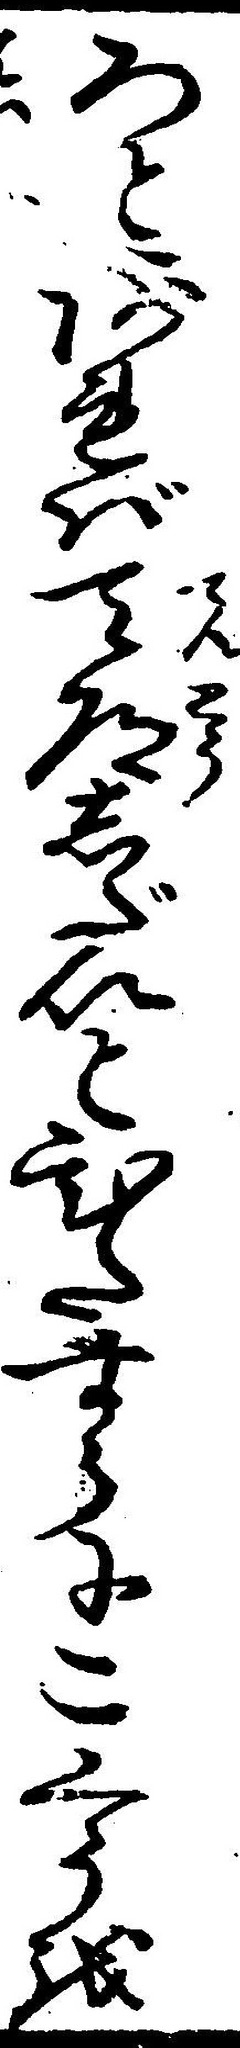ろとあれば天道しだいとひたすらにこくうを
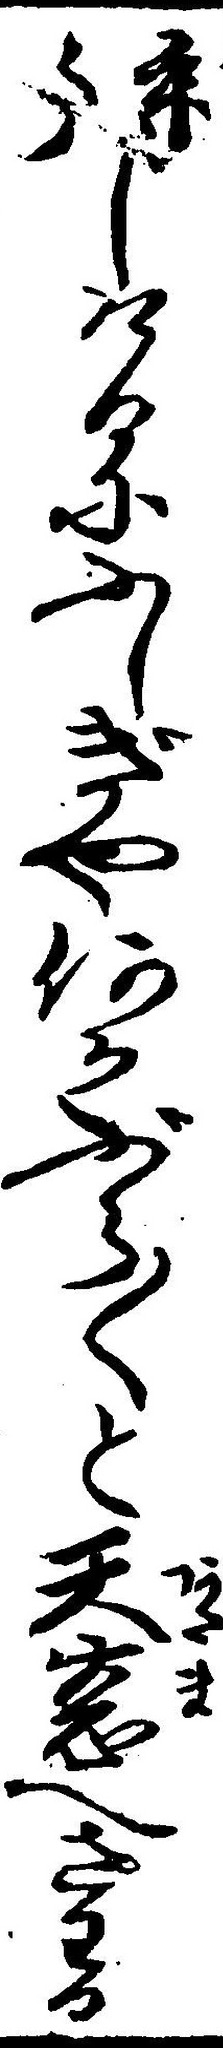拝しけるにふしぎや何かぶら〳〵と天窓へさわる
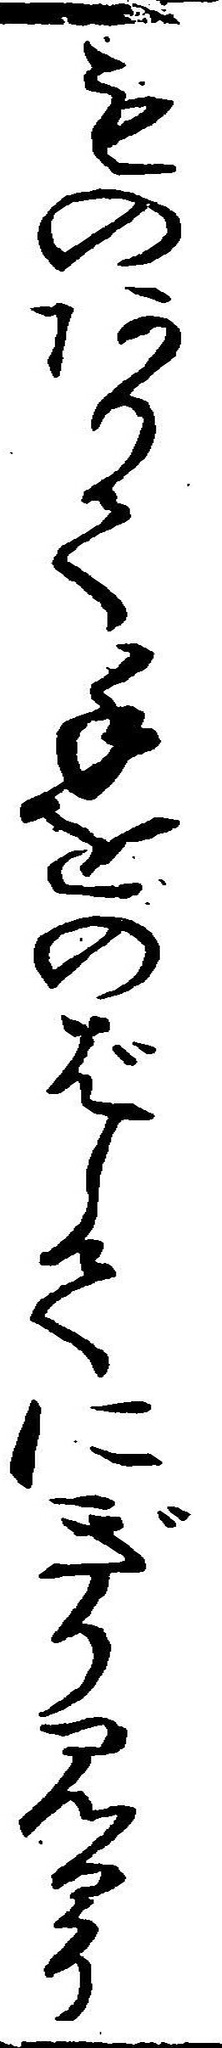ものありて手をのばしてにぎり見るに
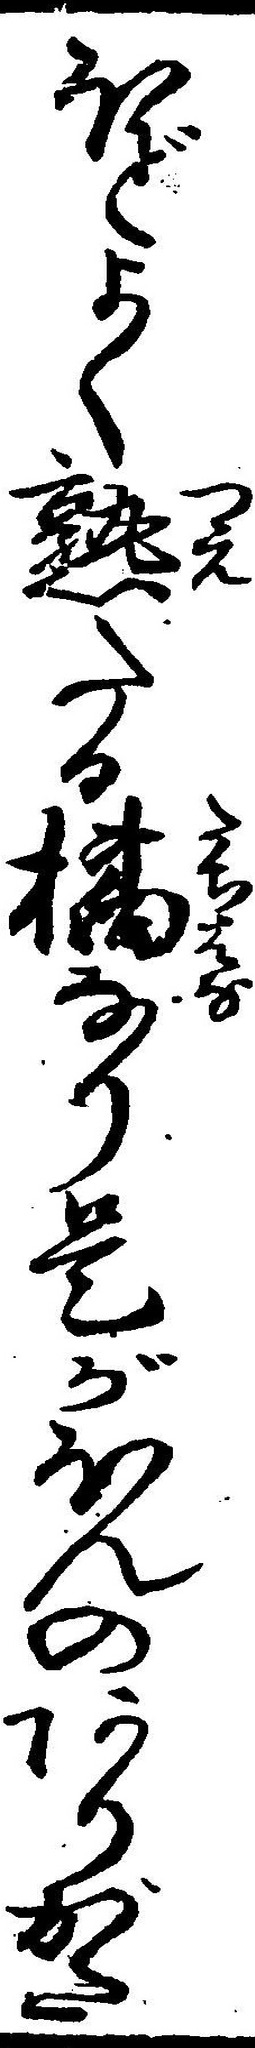ほどよく熟たる橘なり是がほんのありがた
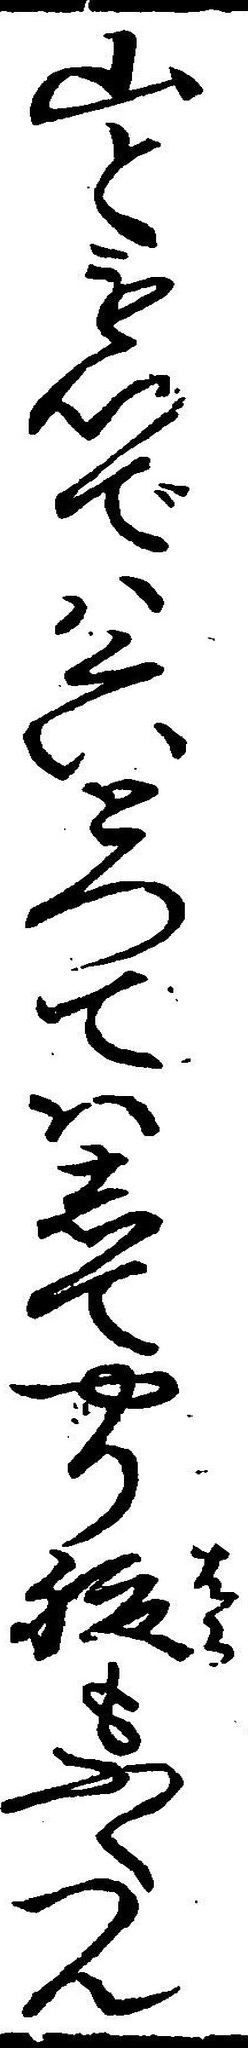山ともいではくいとつてはしてやり腹もふくつん
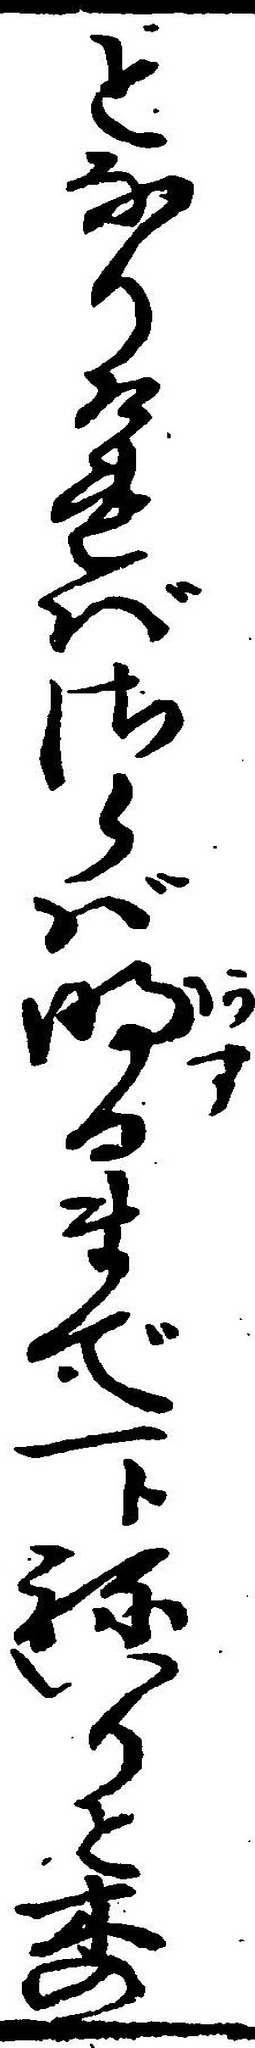となりければさらば明日まで一ねいりと木の

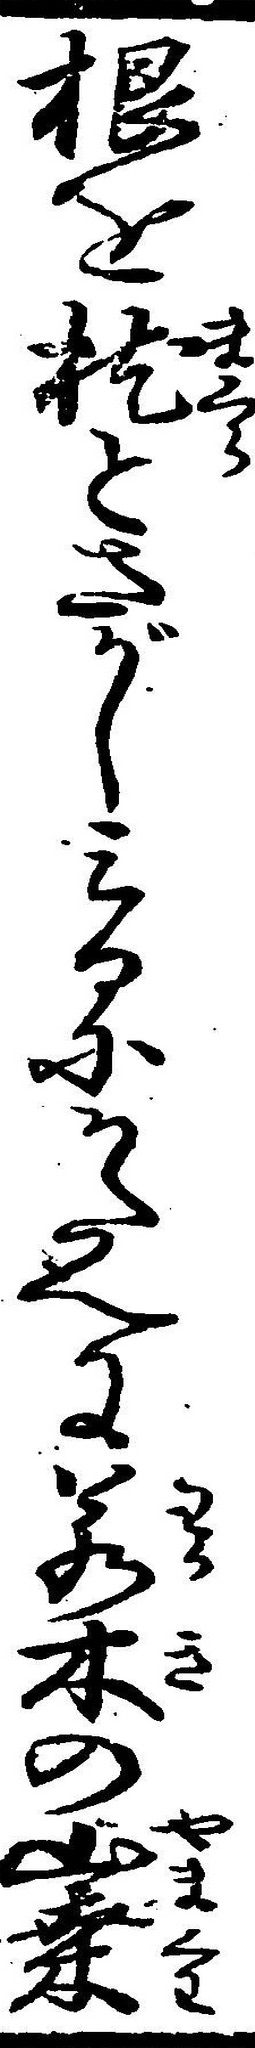根を枕とさがしみるにかたへに若木の山桑
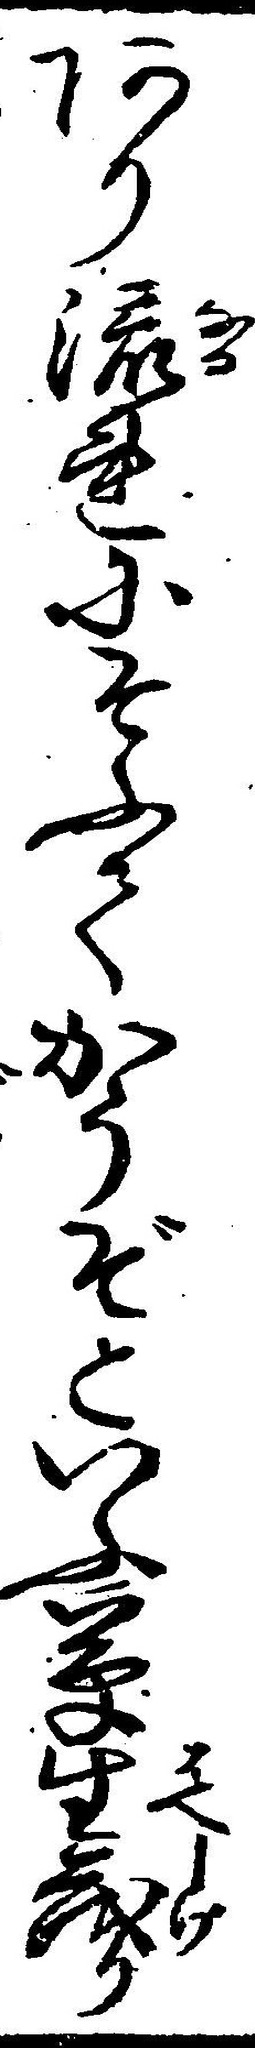あり流れにそふてかうぞといふ草生茂り
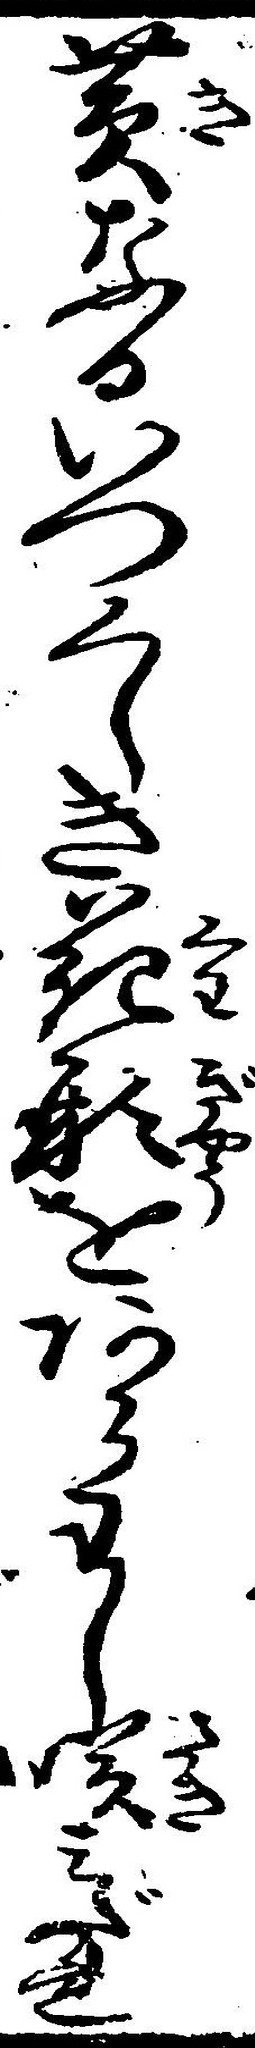黄なるいつくしき花形をあらわし咲きみだれ
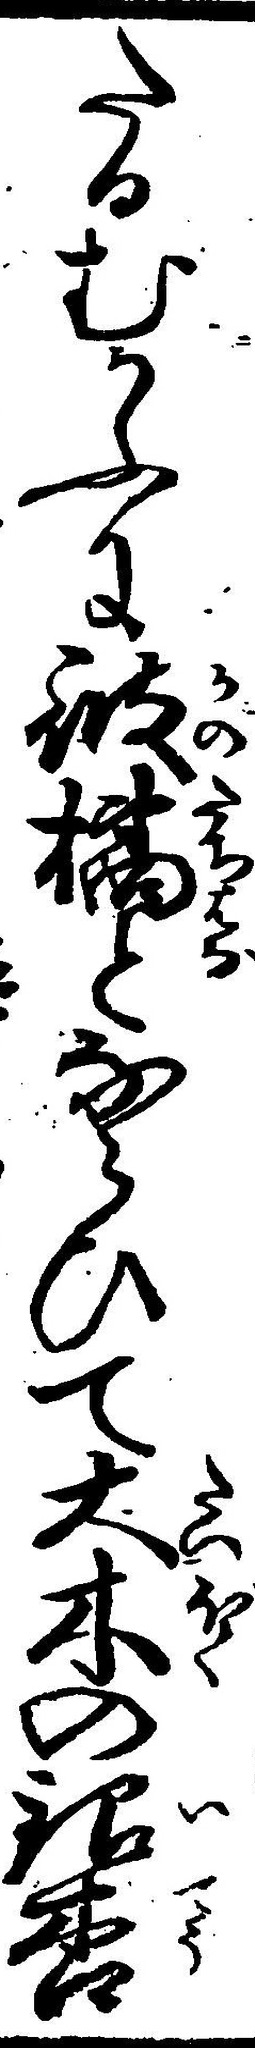たるむかふに彼橘とならひて大木の銀杏
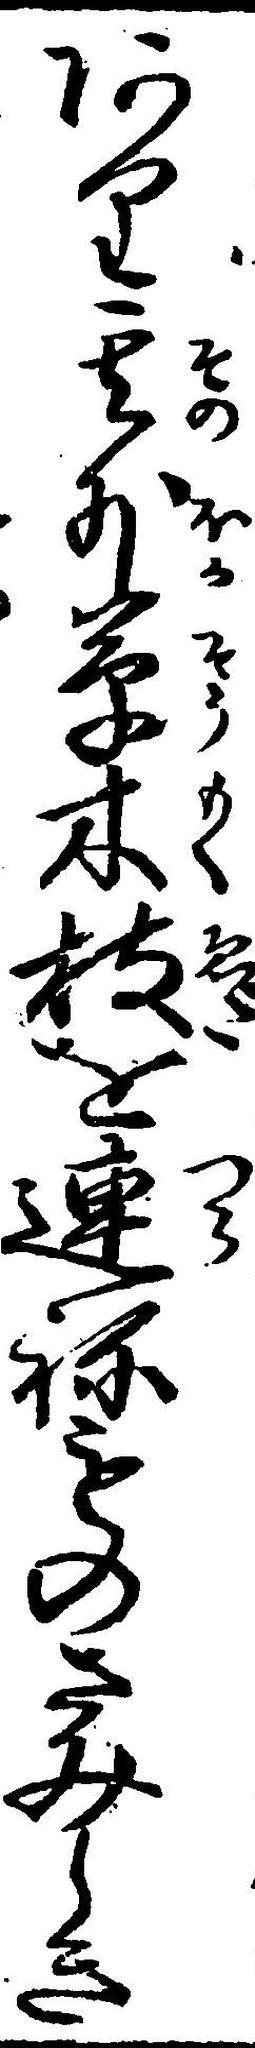あり其外草木枝を連ねものさみしき
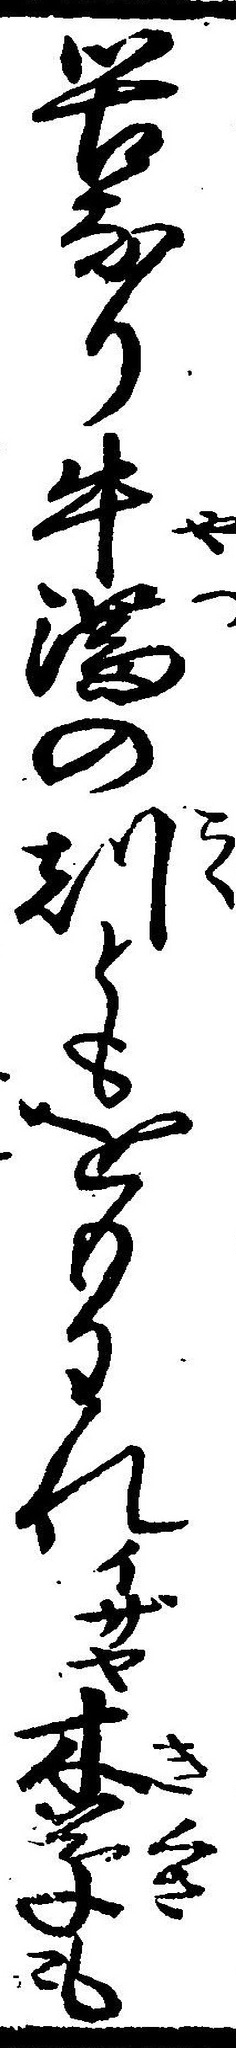谷なり牛満の刻ともをもわれ木草も
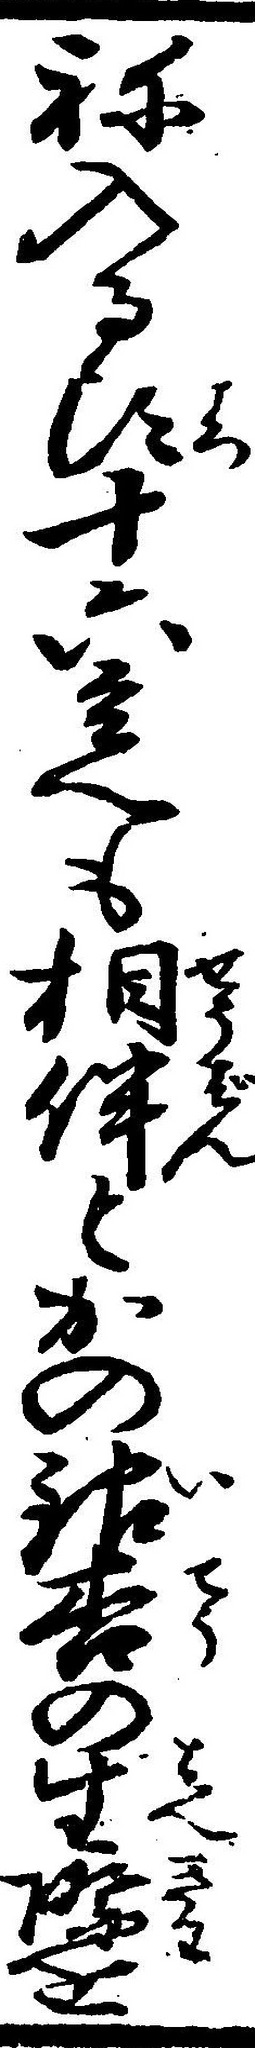ね入る頃十六兵衛も相伴とかの銀杏の生際を
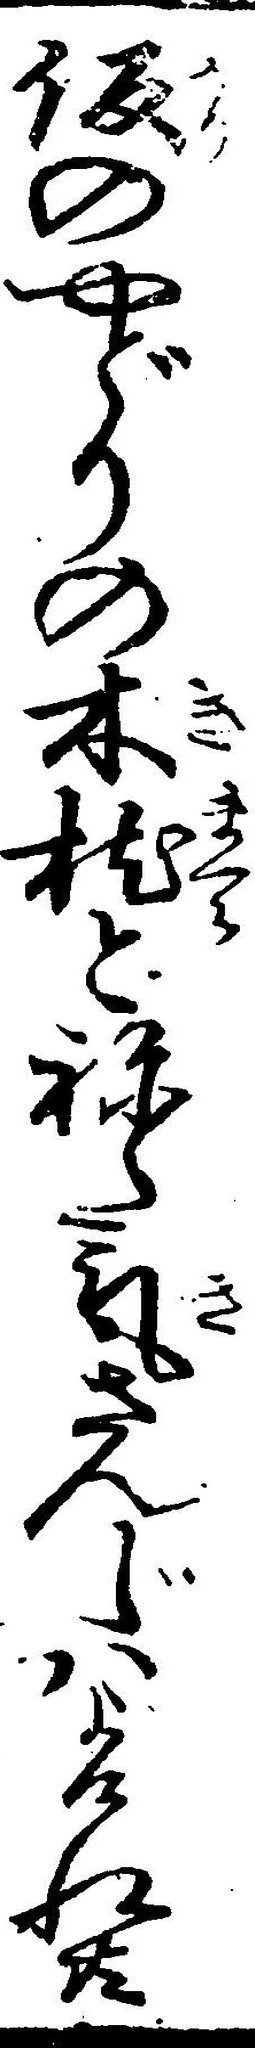仮のやどりの木枕とねた気さんじはよけれ共
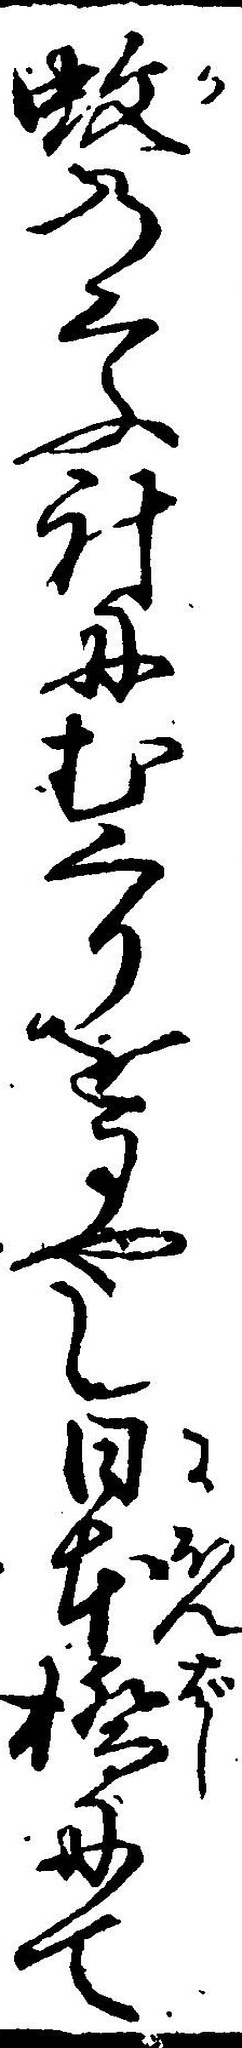蚊のくふ針にむくりをにやし日本橋にて
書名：草木芝居化物退治 / 泉花堂三蝶(十六兵衛)作
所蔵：東京大学総合図書館 General Library in the University of Tokyo, JAPAN
